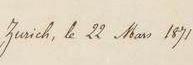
Zurich, le 22 Mars 1871
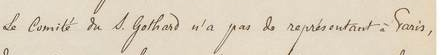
Le Comité du S. Gothard n'a pas de représentant à Paris,
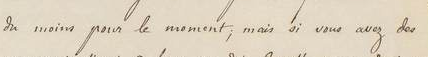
du moins pour le moment; mais si vous avez des
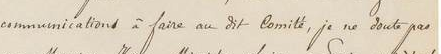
communications à faire au dit Comité, je ne doute pas
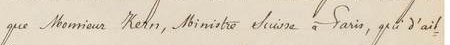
que Monsieur Kern, Ministre Suisse à Paris, qui d'ail-
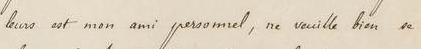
leurs est mon ami personnel, ne veuille bien se
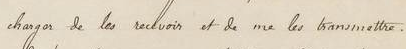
charger de les recevoir et de me les transmettre.
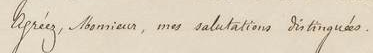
Agréez, Monsieur, mes salutations distinguées.
